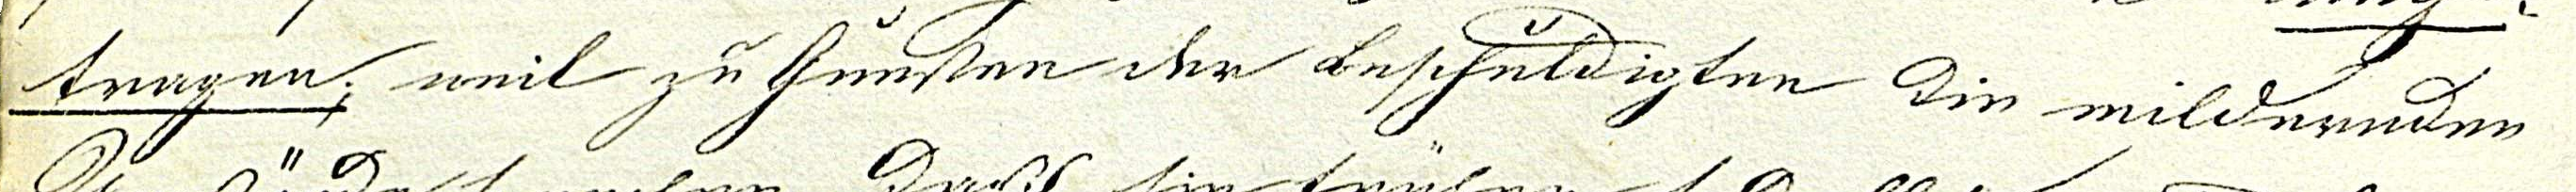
tragen; weil zu Gunsten der Beschuldigten die milderenden
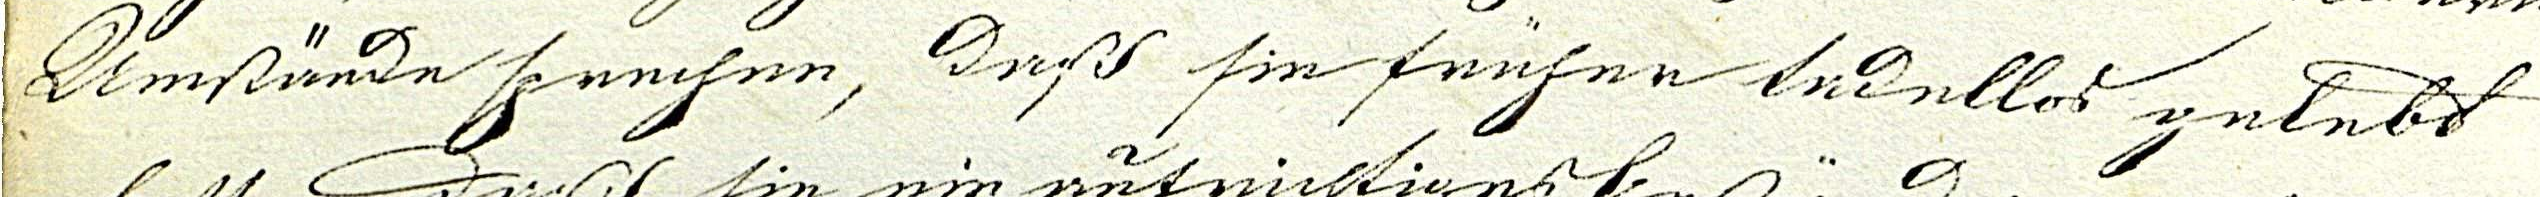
Umstände sprechen, daß sie früher tadellos gelebt
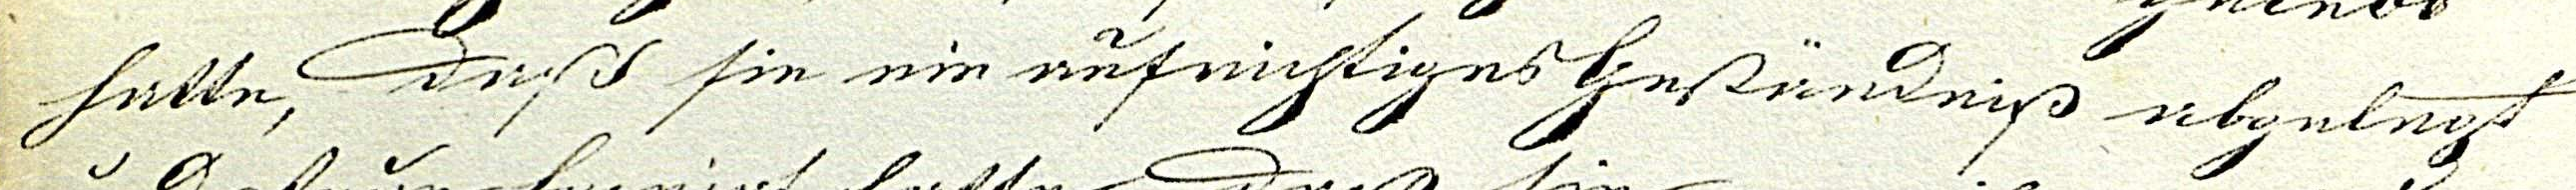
hatte, daß sie ein aufrichtiges Geständniß abgelegt
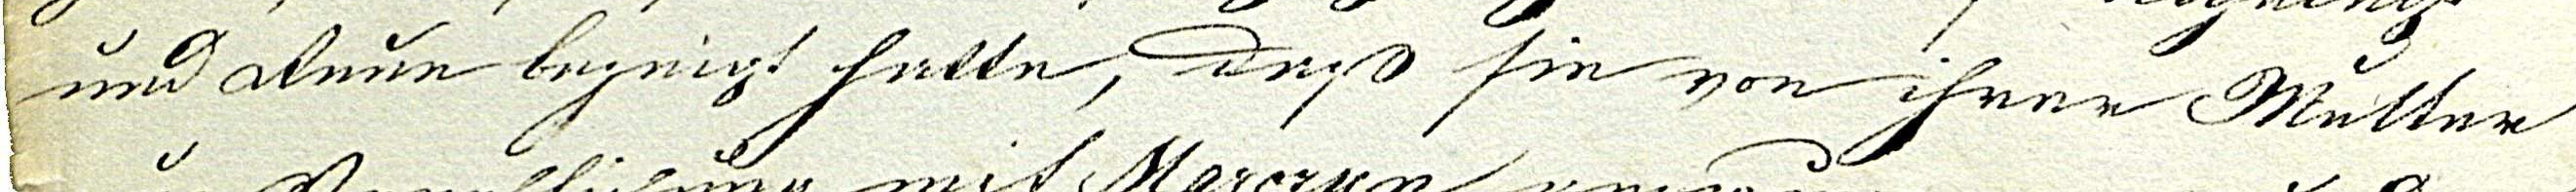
und Reue bezeigt hatte, daß sie von ihrer Mutter
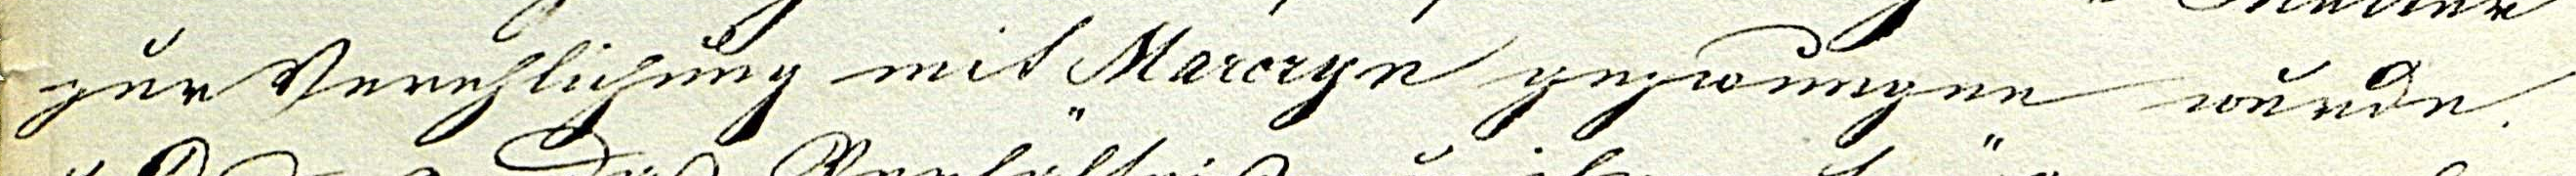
zur Verehlichung mit Marczyn gezwungen wurde
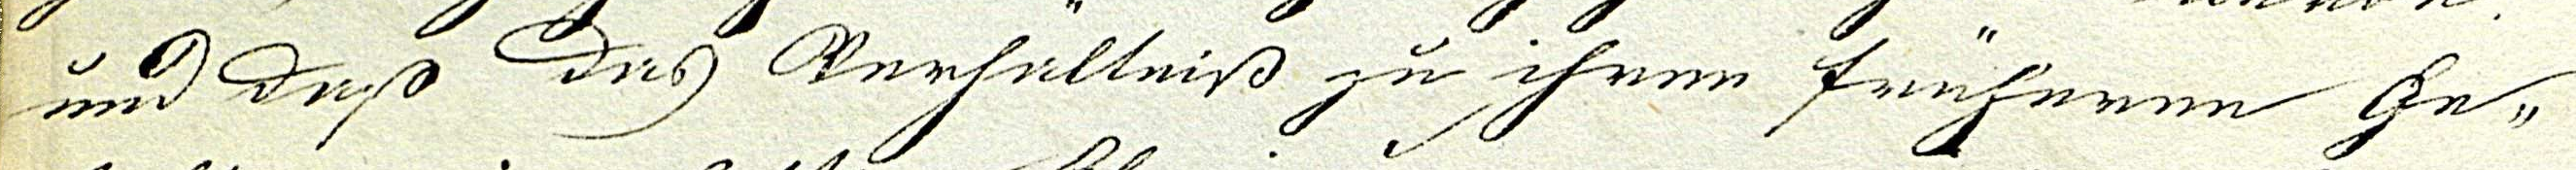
und daß das Verhältniß zu ihrem früheren Ge¬
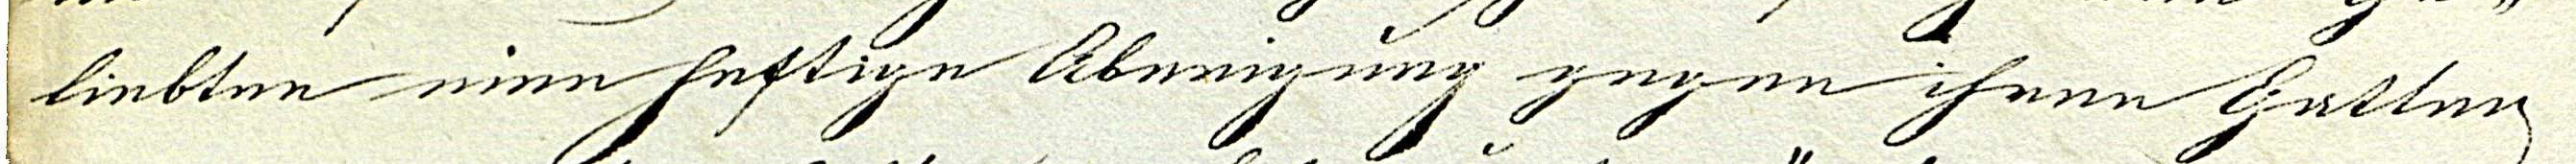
liebten eine heftige Abneigung gegen ihren Gatten
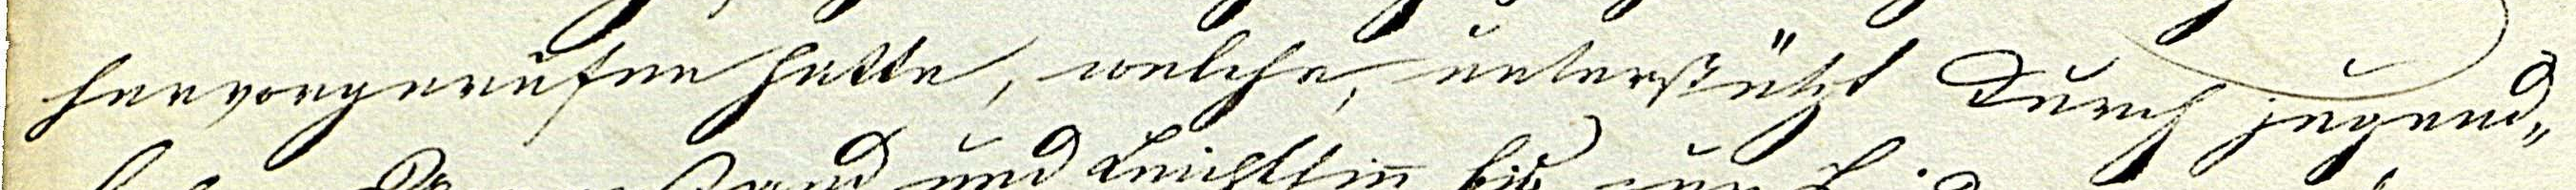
hervorgerufen hatte, welche, unterstützt durch jugend¬
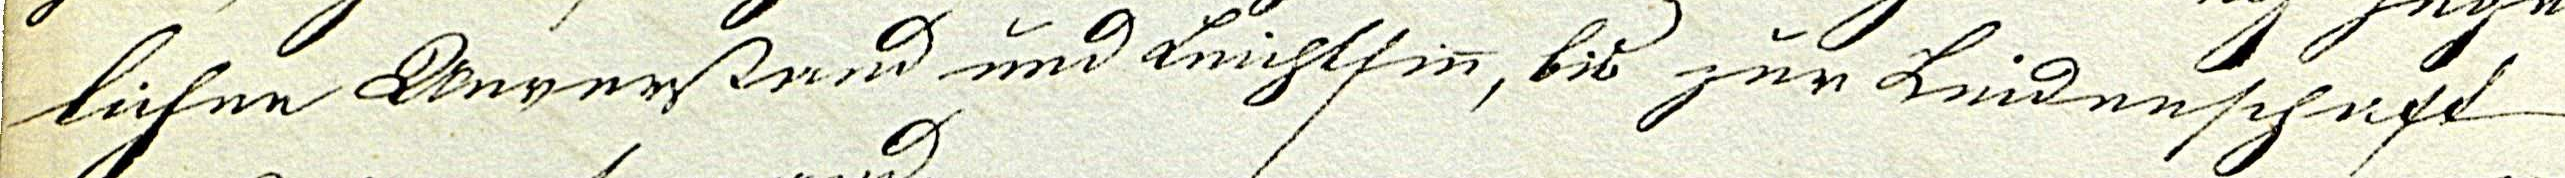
lichen Unverstand und Leichtsinn, bis zur Leidenschaft
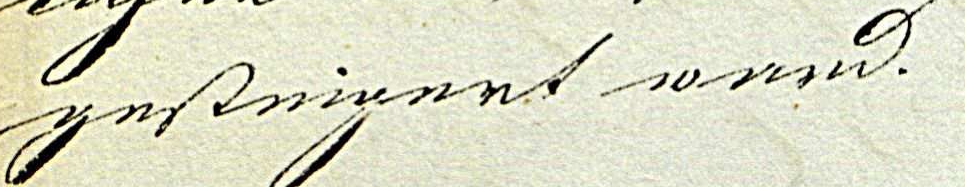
gesteigert ward.
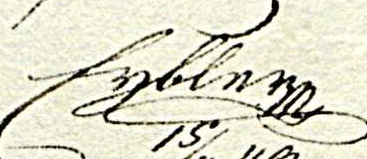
Eybler
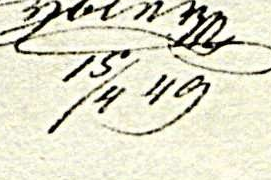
15/4/49
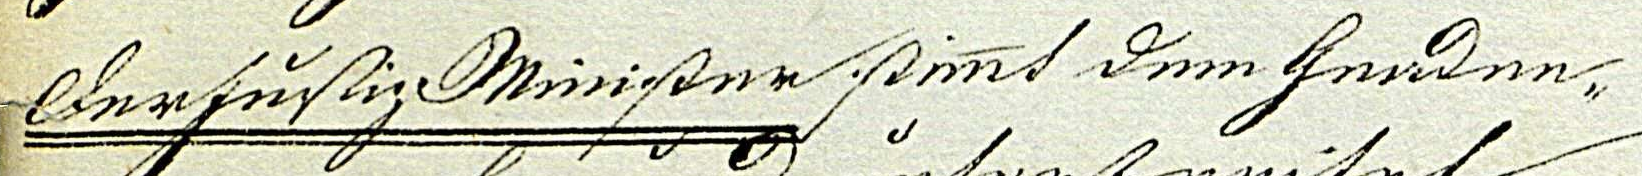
Der Justiz Minister stimmt dem Gnaden¬
